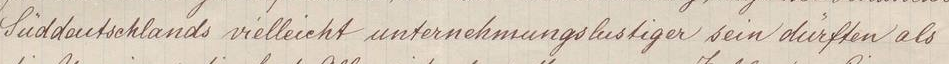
Süddeutschlands vielleicht unternehmungslustiger sein dürften als
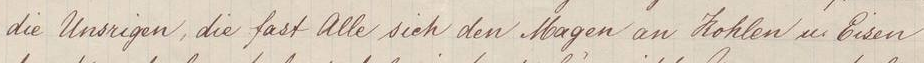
die Unsrigen, die fast Alle sich den Magen an Kohlen u. Eisen
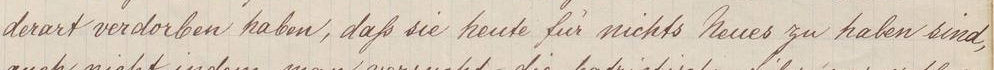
derart verdorben haben, daß sie heute für nichts Neues zu haben sind,
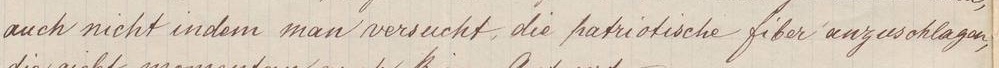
auch nicht indem man versucht, die patriotische Fiber anzuschlagen;
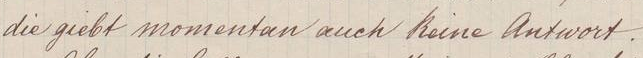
die giebt momentan auch keine Antwort.
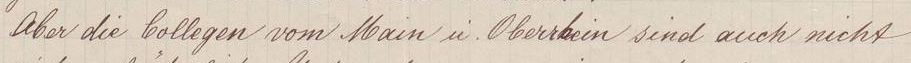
Aber die Collegen vom Main u. Oberrhein sind auch nicht
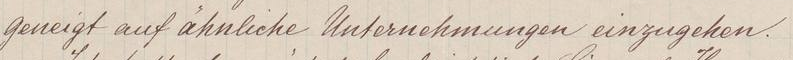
geneigt auf ähnliche Unternehmungen einzugehen.
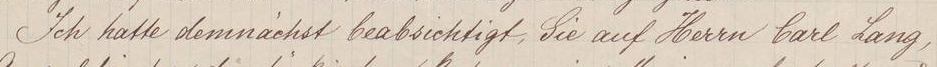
Ich hatte demnächst beabsichtigt, Sie auf Herrn Carl Lang,
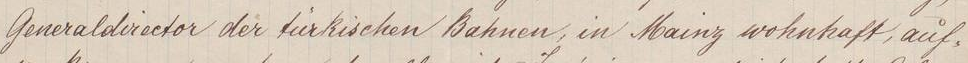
Generaldirector der türkischen Bahnen, in Mainz wohnhaft, auf-
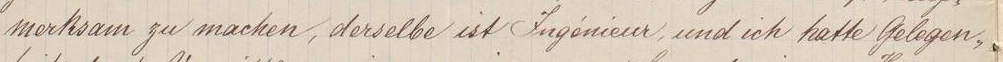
merksam zu machen, derselbe ist Ingénieur, und ich hatte Gelegen-
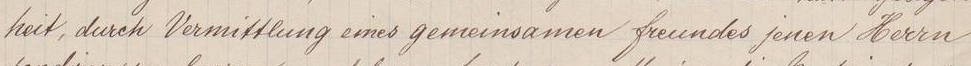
heit, durch Vermittlung eines gemeinsamen Freundes jenen Herrn
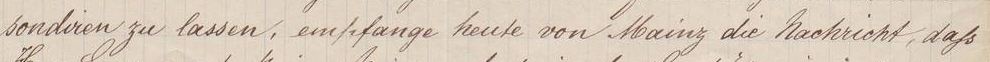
sondiren zu lassen, empfange heute von Mainz die Nachricht, daß
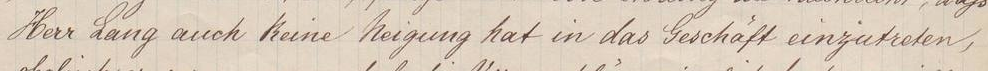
Herr Lang auch keine Neigung hat in das Geschäft einzutreten,
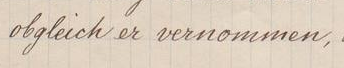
obgleich er vernommen,
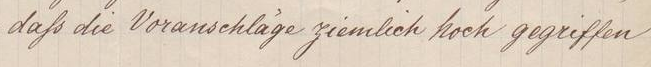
daß die Voranschläge ziemlich hoch gegriffen
